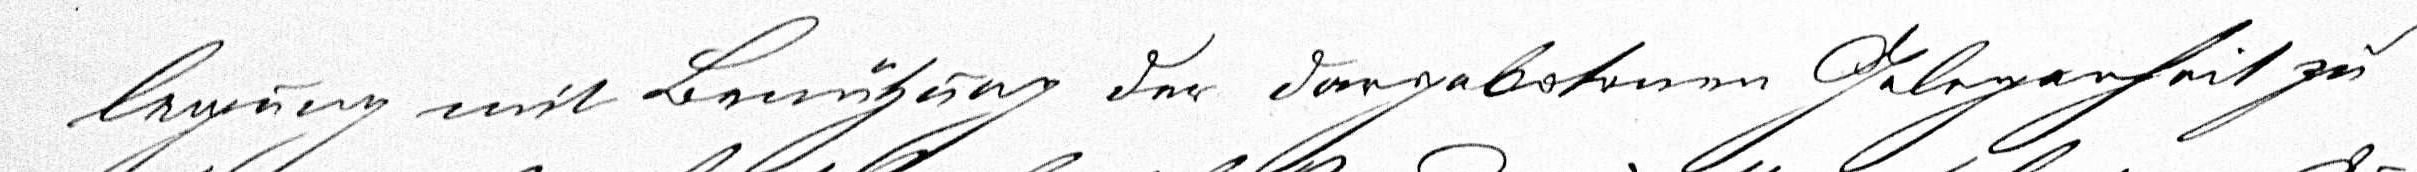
legung mit Benützung der dargebotenen Gelegenheit zu
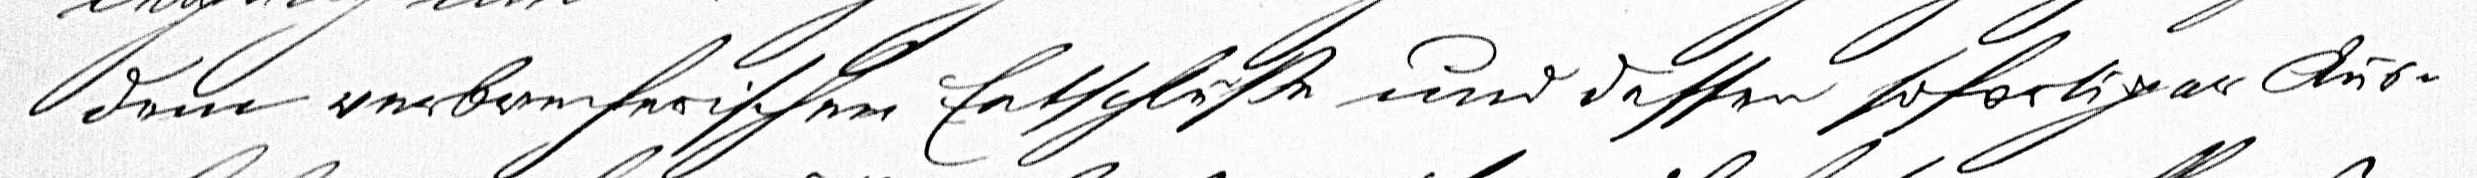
dem verbrecherishen Entschluße und dessen sofortigen Aus¬
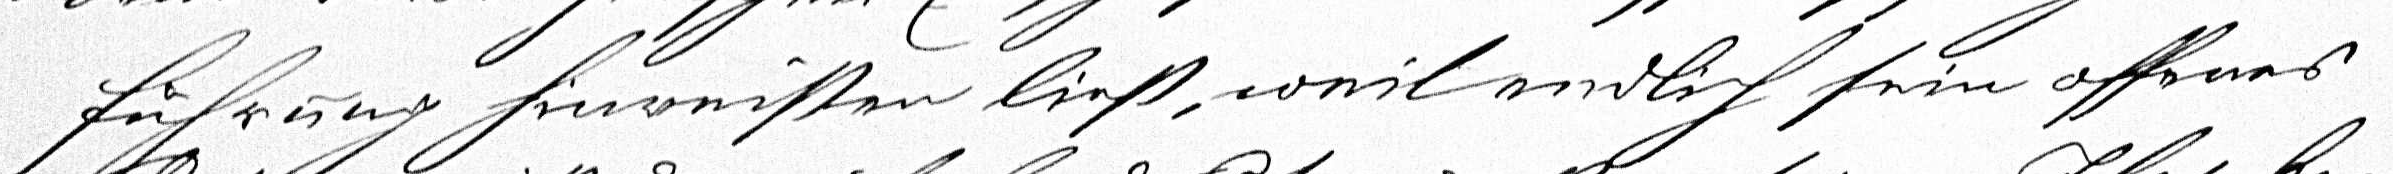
führung hinreißen ließ, weil endlich sein offenes
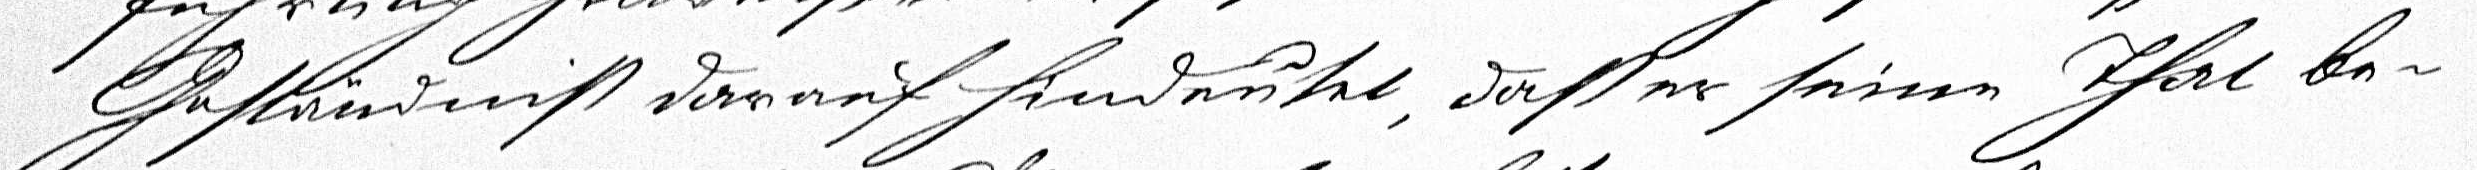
Geständniß darauf hindeutet, daß er seine That be¬
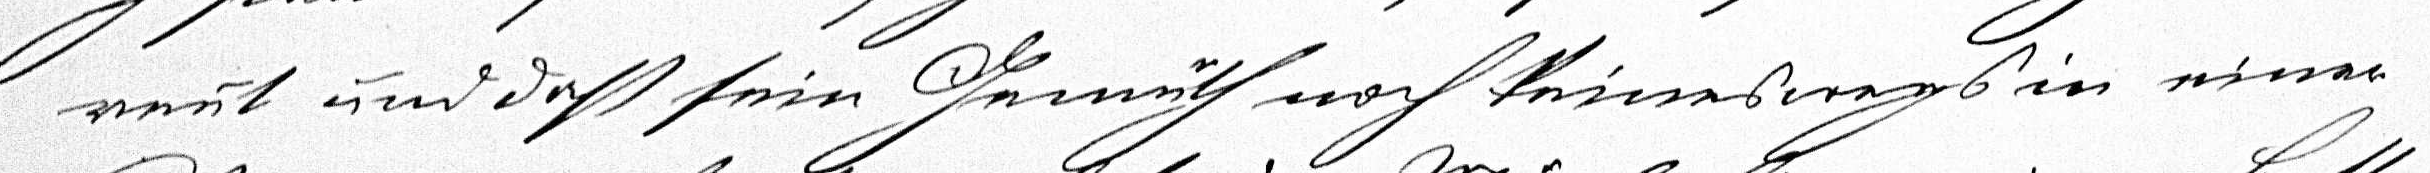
reut und daß sein Gemüth noch keineswegs in einer
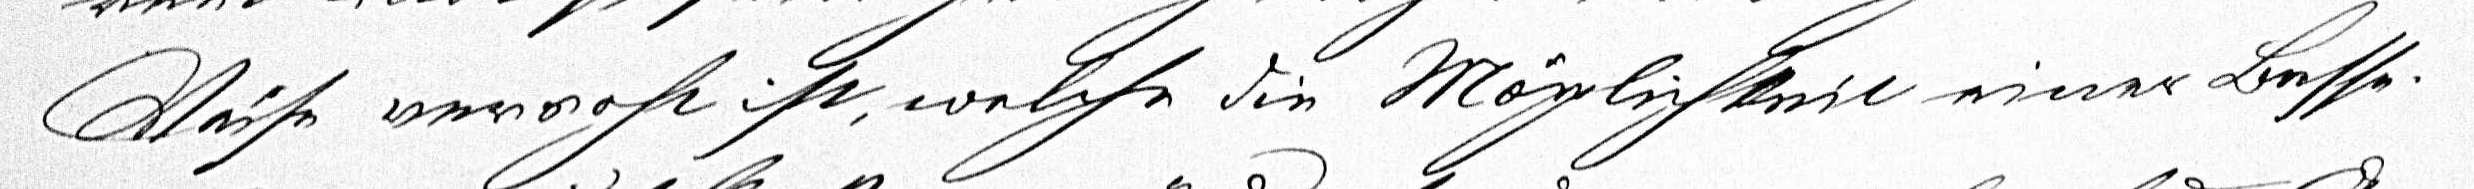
Weise verroht ist, welche die Möglichkeit einer Besse¬
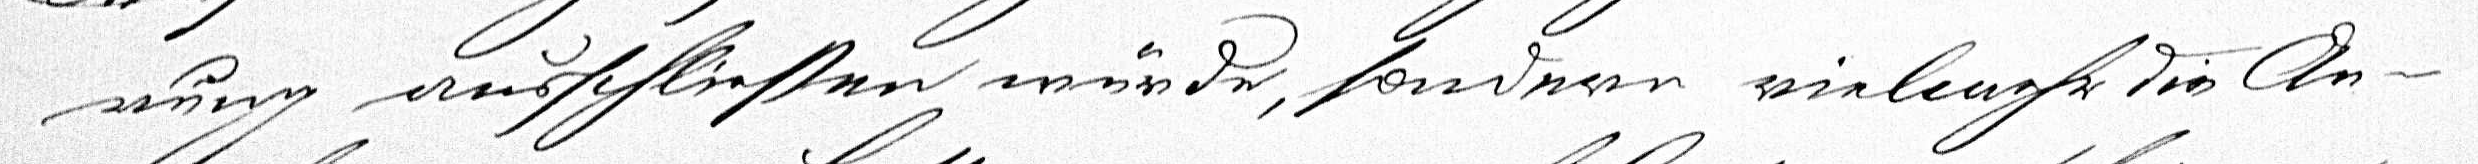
rung ausschließen würde, sondern vielmehr die An¬
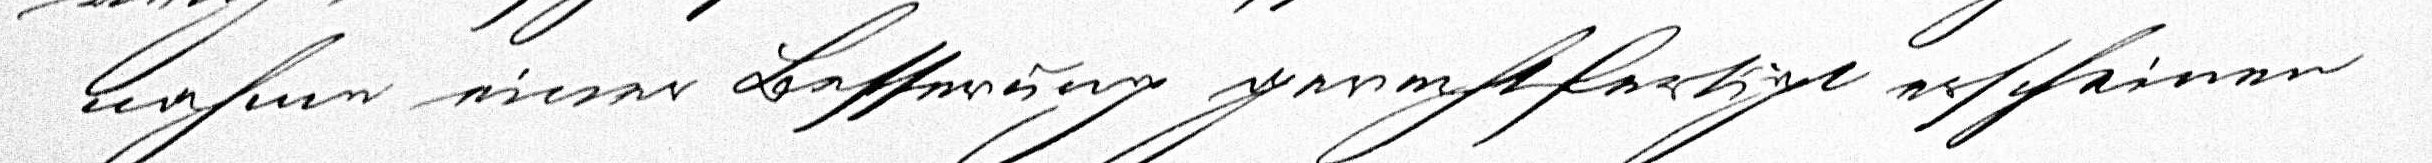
nahme einer Besserung gerechtfertigt erscheinen
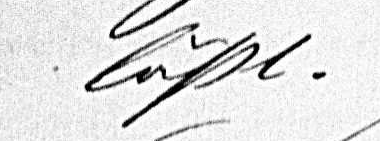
läßt.
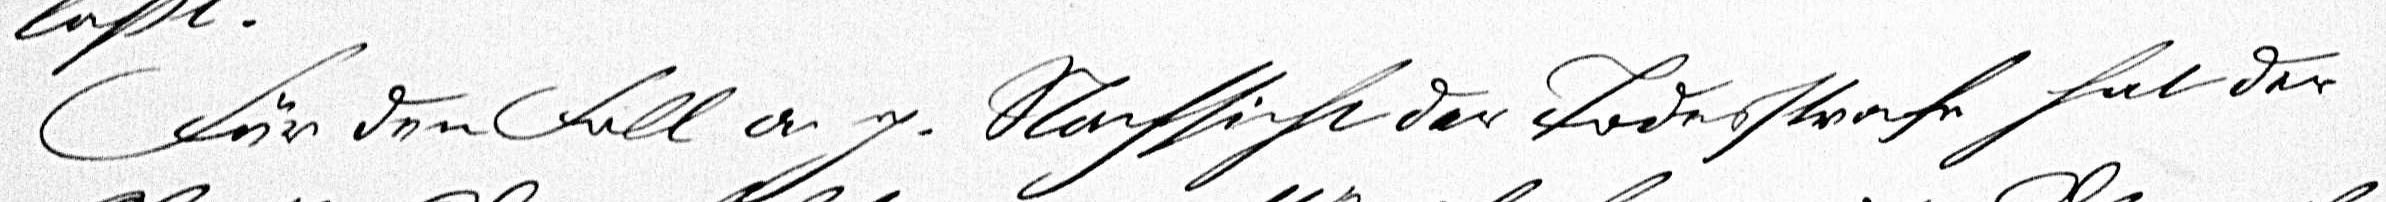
Für den Fall a.g. Nachsicht der Todesstrafe hat der
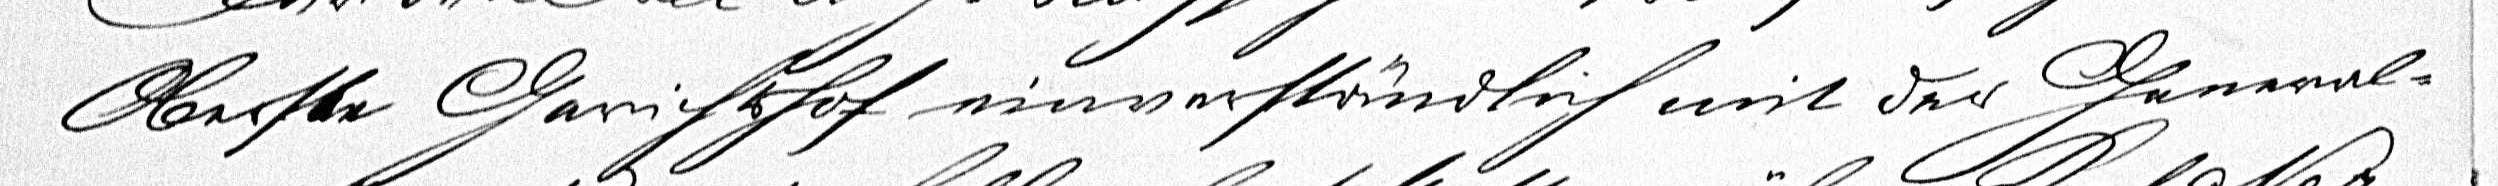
Oberste Gerichtshof einverständlich mit der General¬
